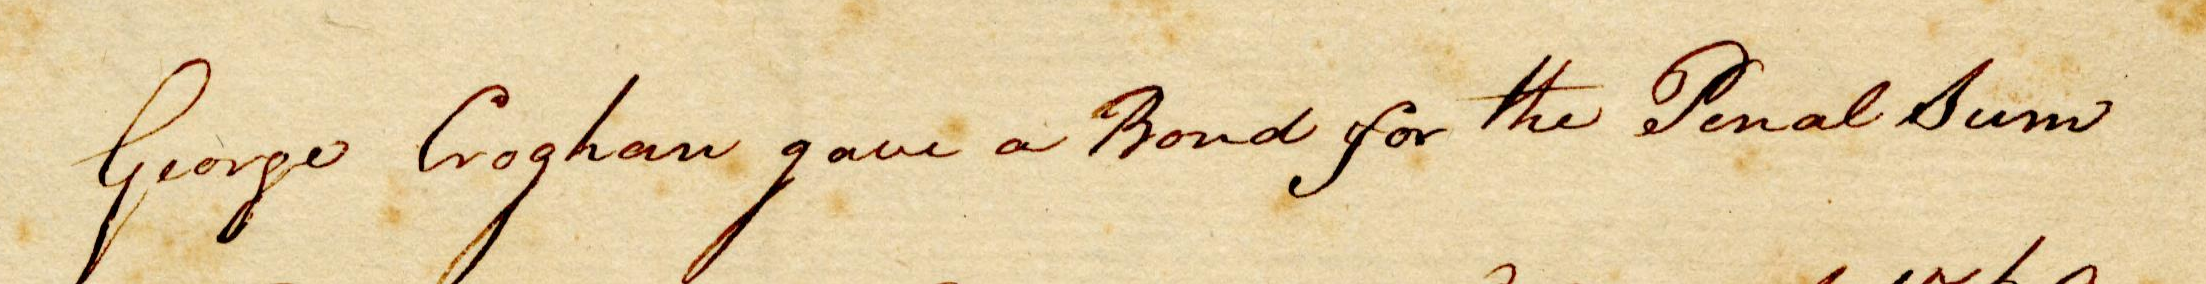George Croghan gave a Bond for the Penal sum
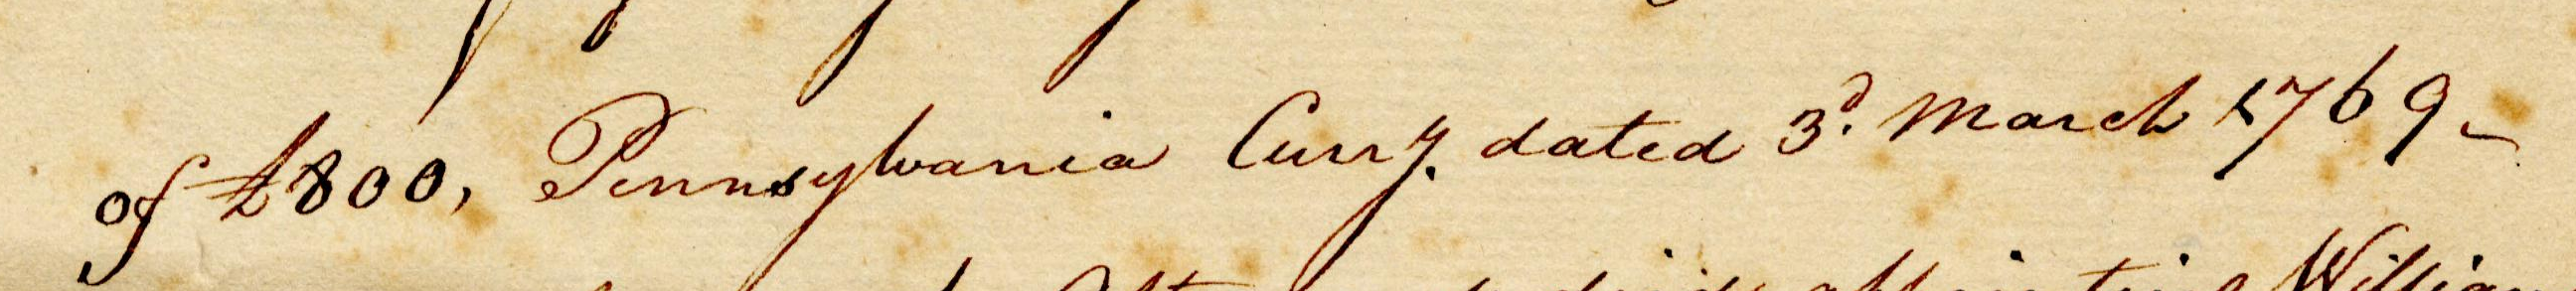of £800, Pennsylvania Curr^y. dated 3^d. March 1769-
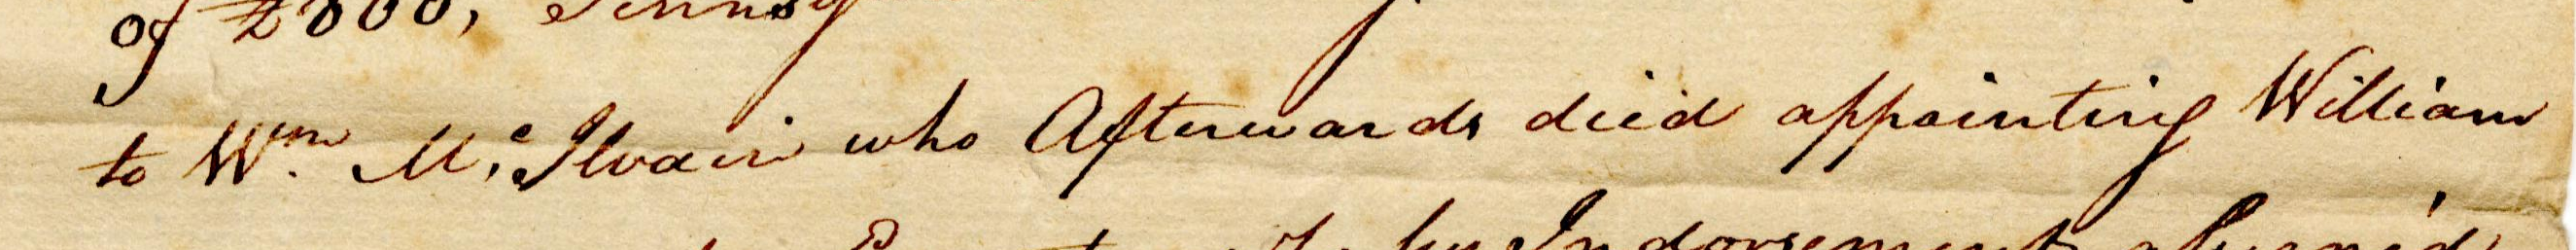to W^m. M^c.Ilvaine who afterwards died appointing William
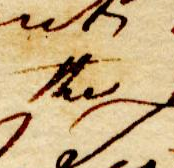the
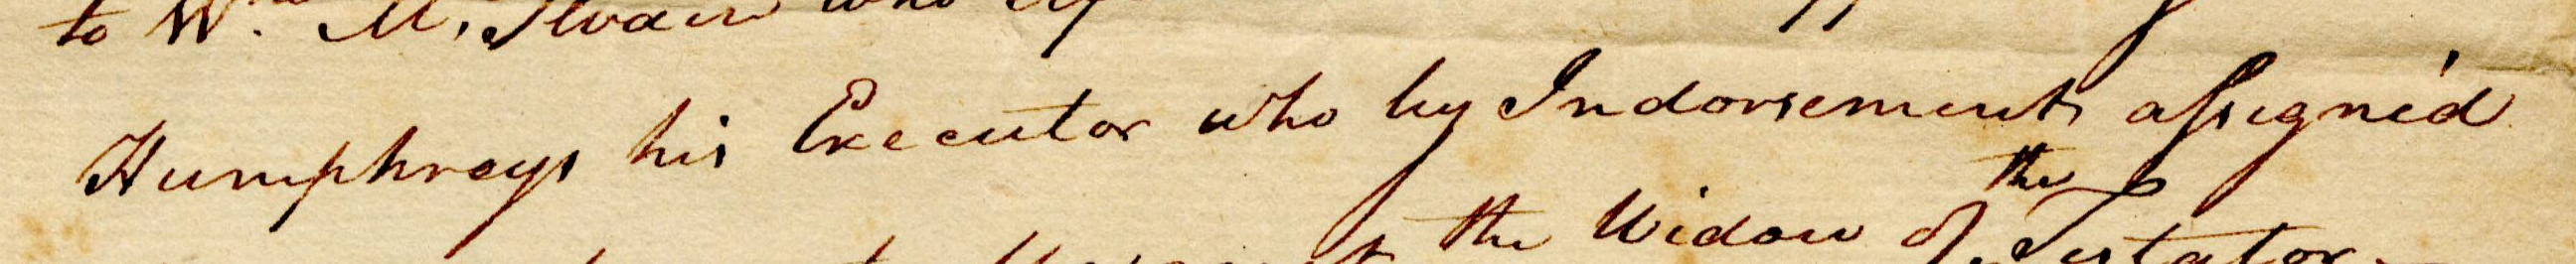Humphreys his Executar who by Indorsement assigned
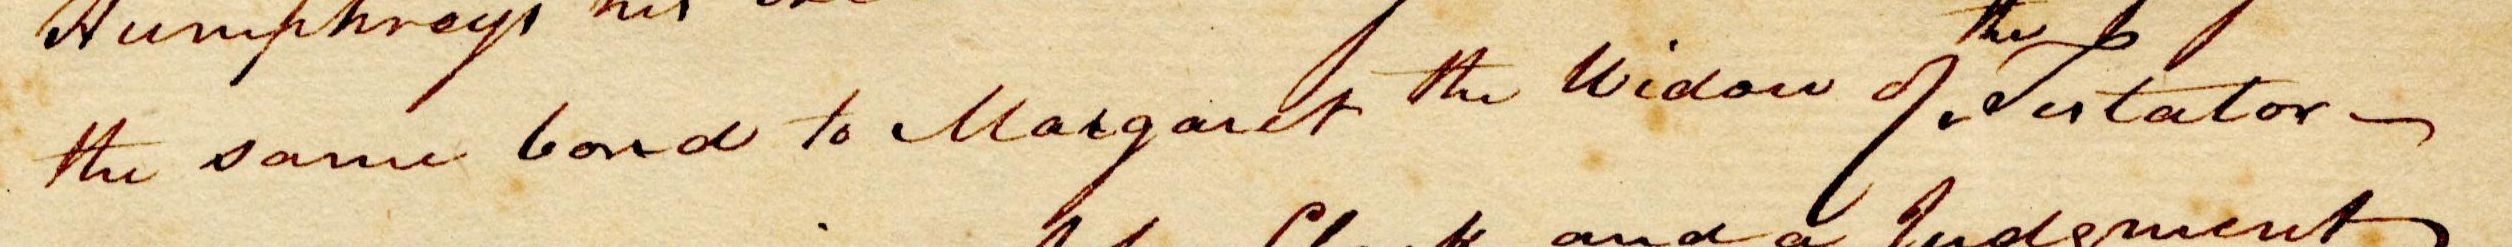the same bond to Margaret the Widow of ^ Testator-
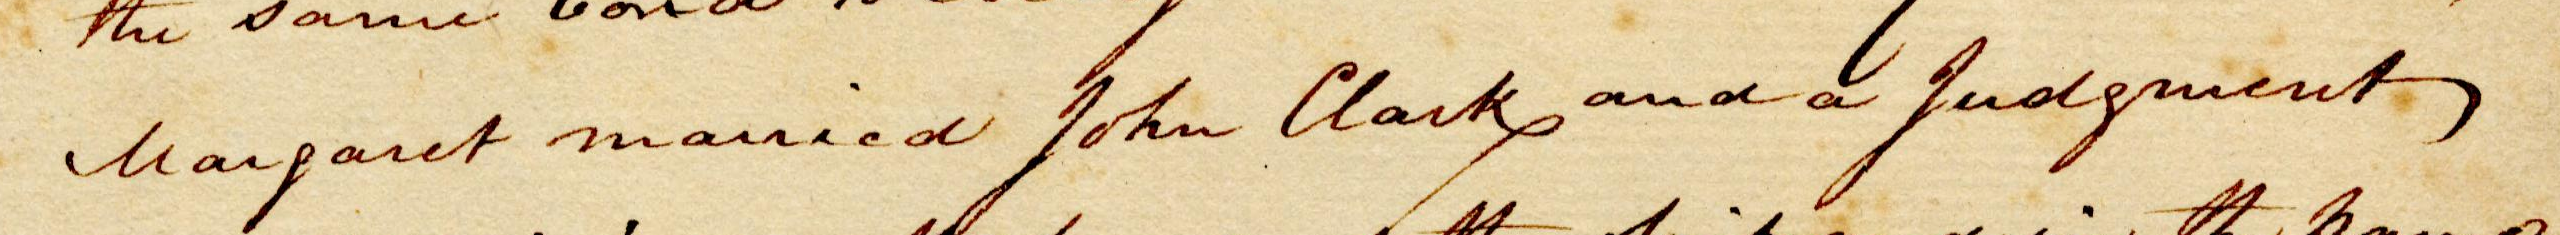Margaret married John Clark and a Judgment
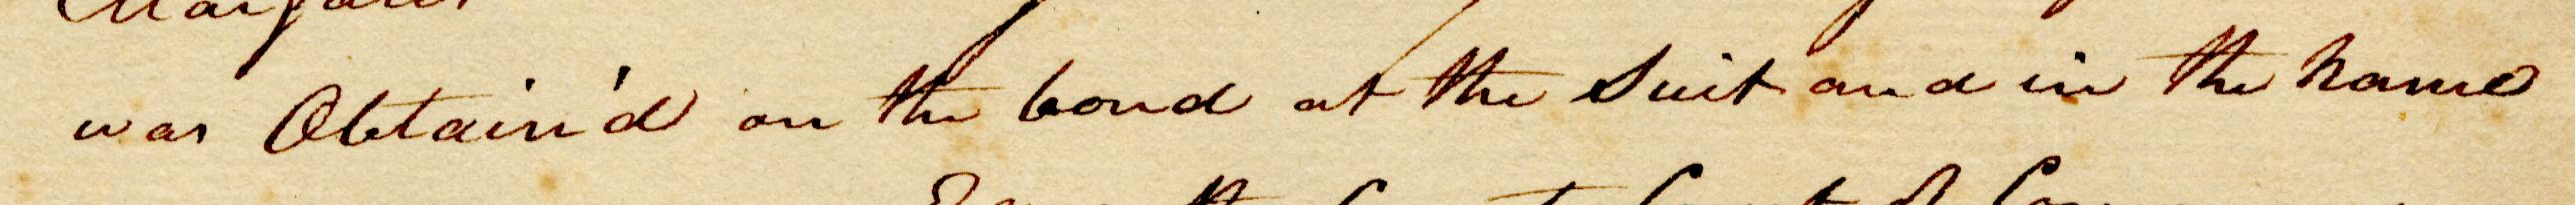was Obtain'd on the bond at the suit and in the names
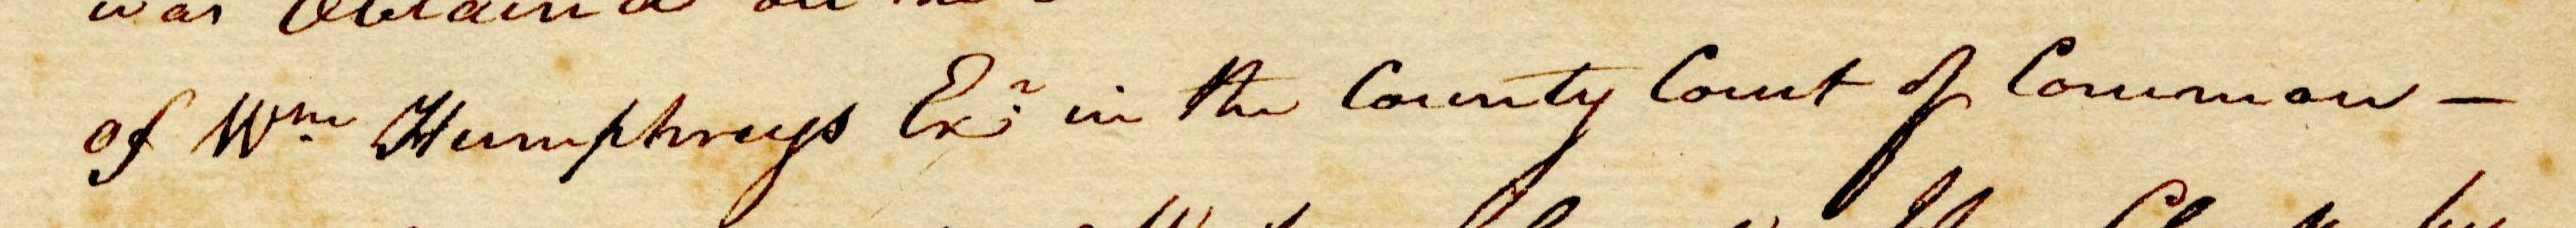of W^m. Humphreys Ex^r. in the County Court of Common-
